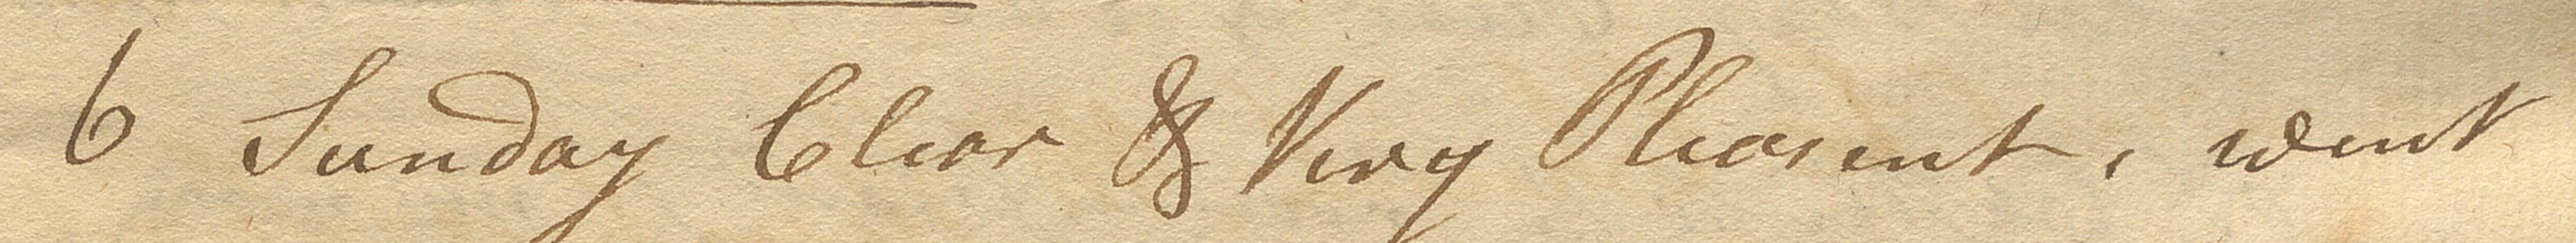6 Sunday Clear & Very Pleasent, went
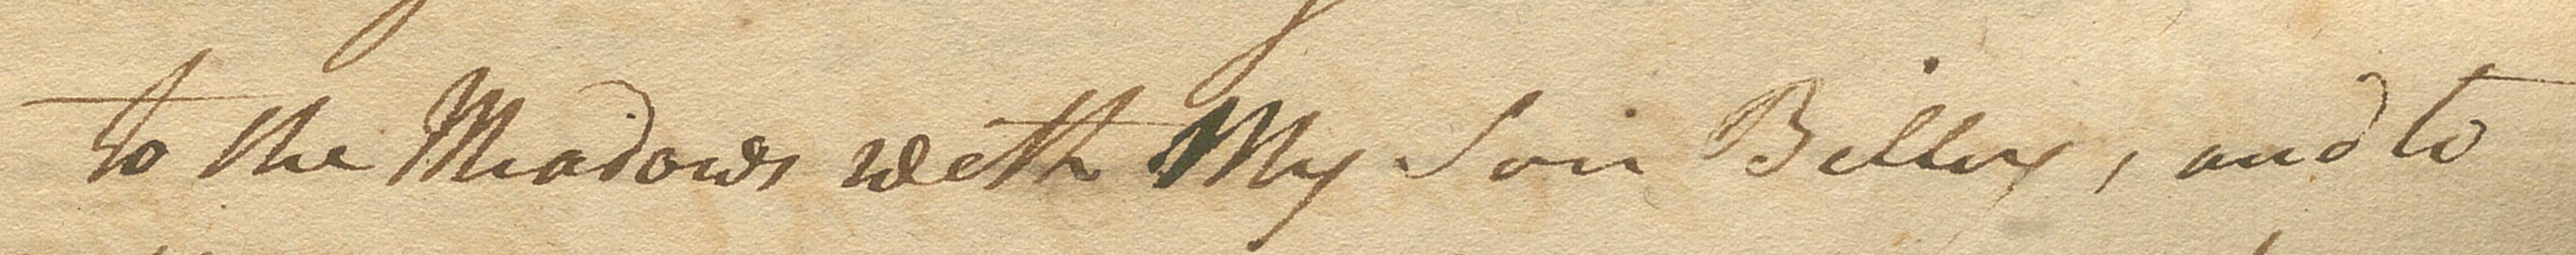to the Meadows with My Son Billey, and to
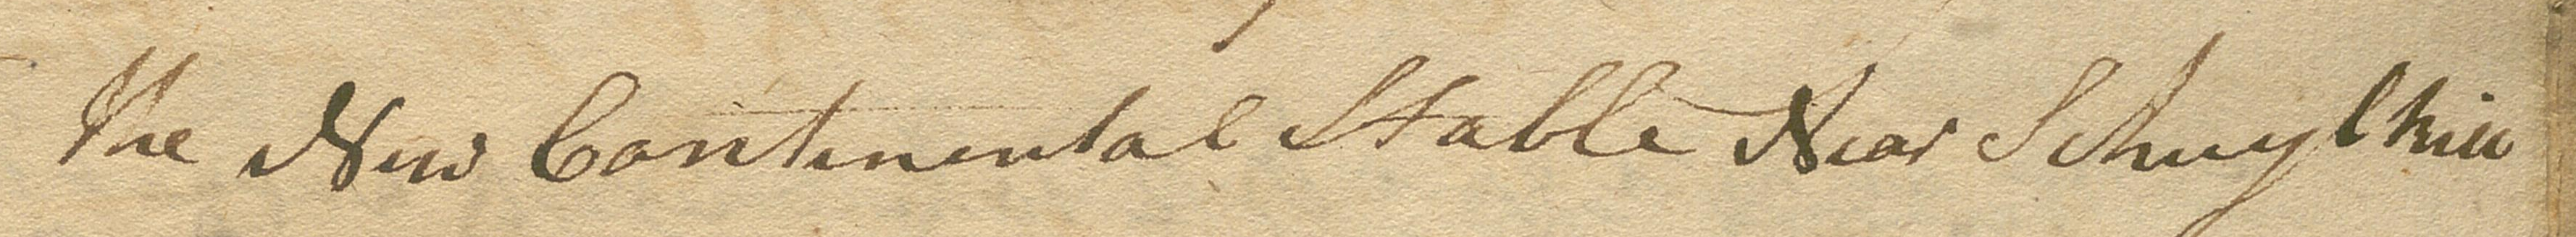the New Continental Stable Near Schuylkill
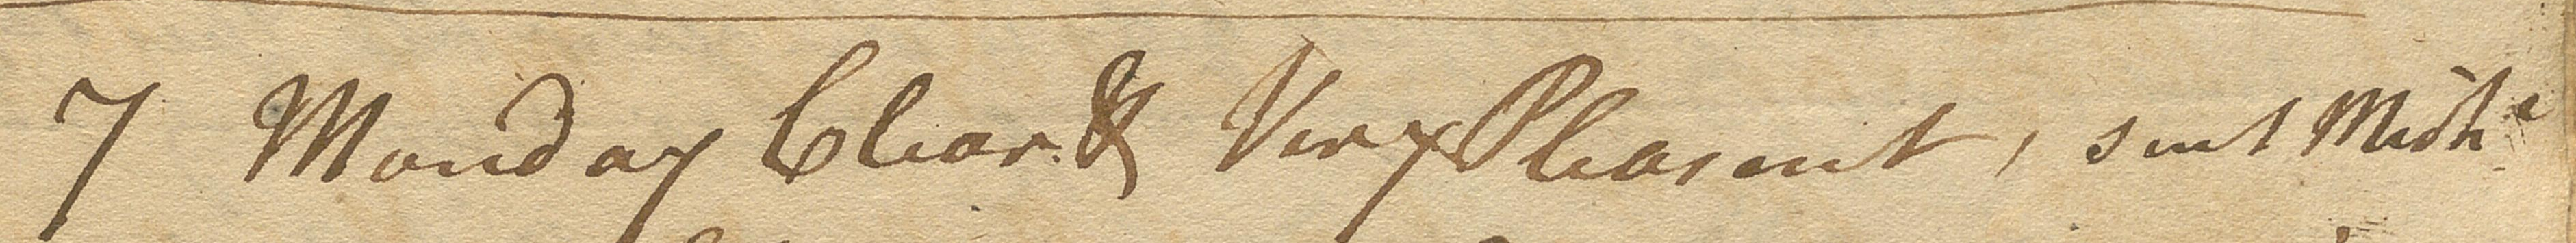7 Monday Clear & Very Pleasent, sent Mich^l
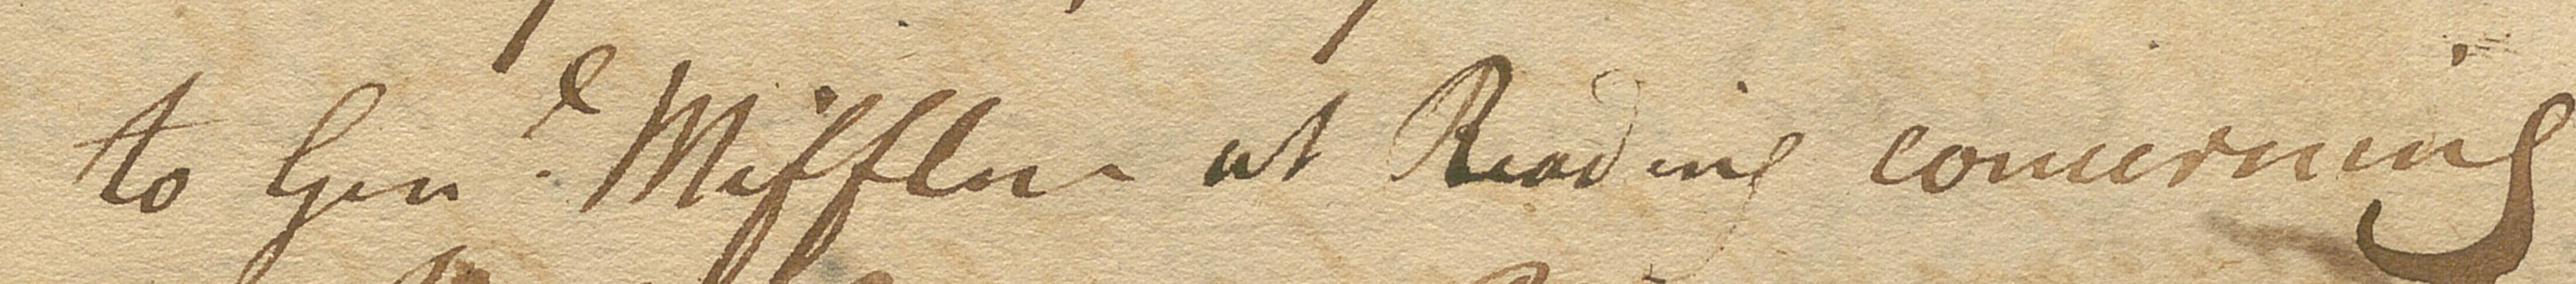to Gen^l. Mifflin at Reading concerning
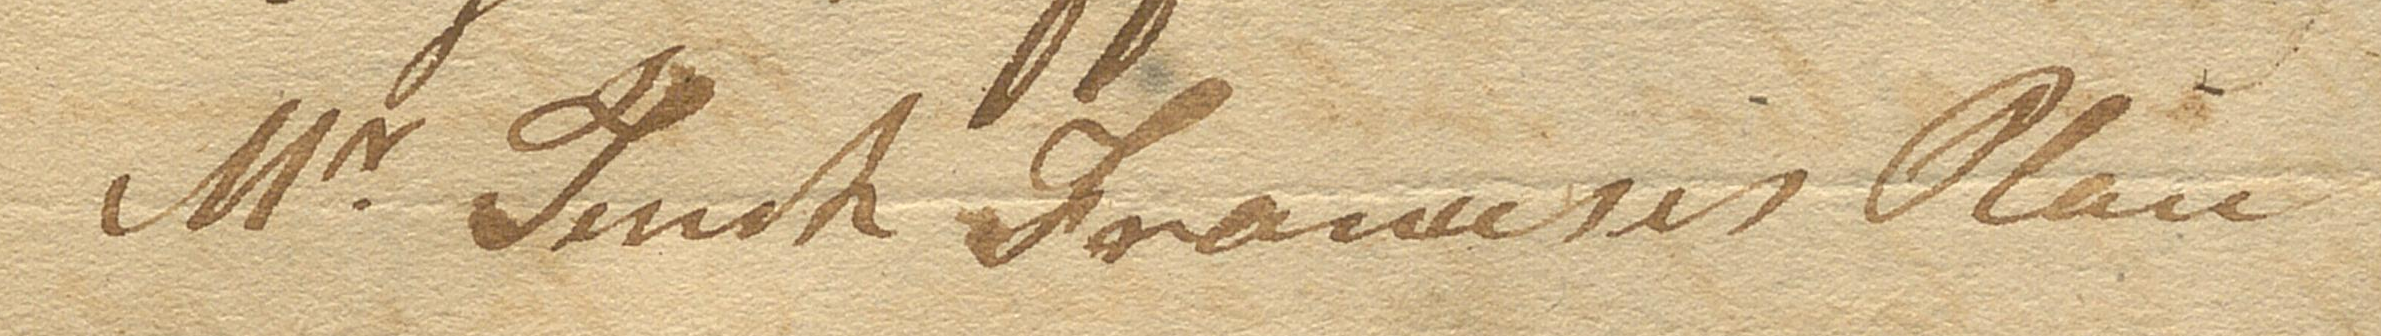M^r. Tench Franceses Place
